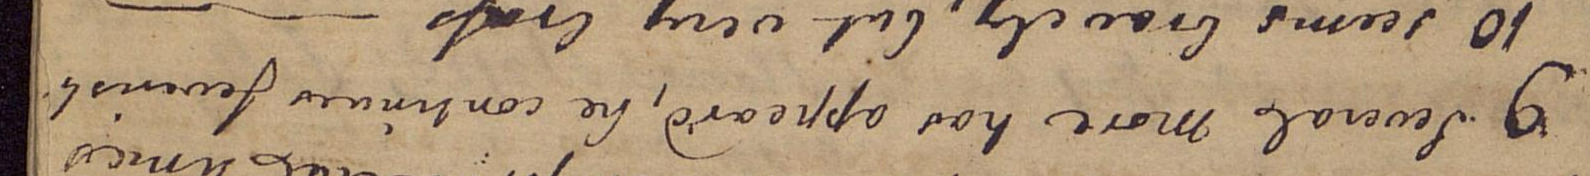9 Several more has appear'd, he continues feverish
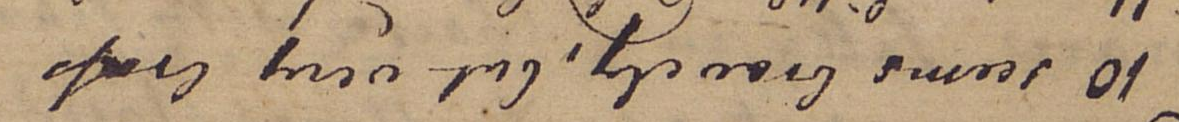10 seems bravely, but very crass
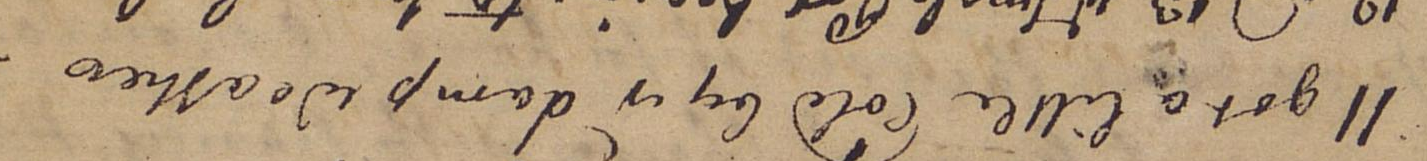11 got a little cold by y^e damp weather
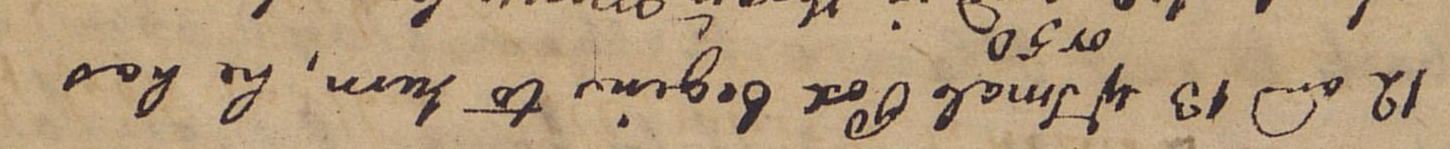12 and 13 y^e Smal Pox begins to turn, he has
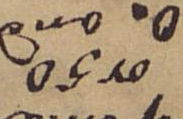or 50.
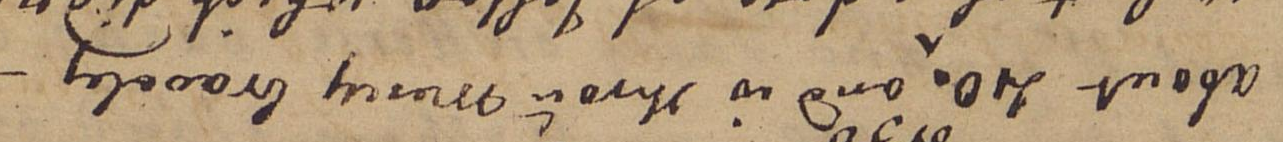about 40, ^ and is thron Mercy bravely.
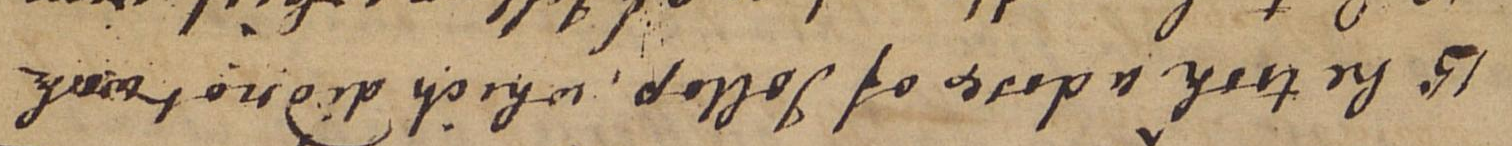15 he took a dose of Jollop, which did not work
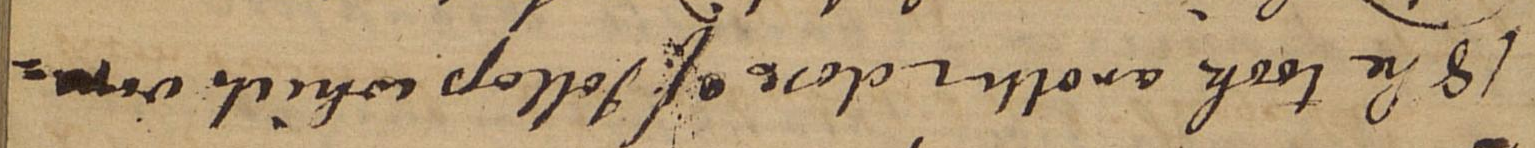18 he took another dose of Jollop which vom-
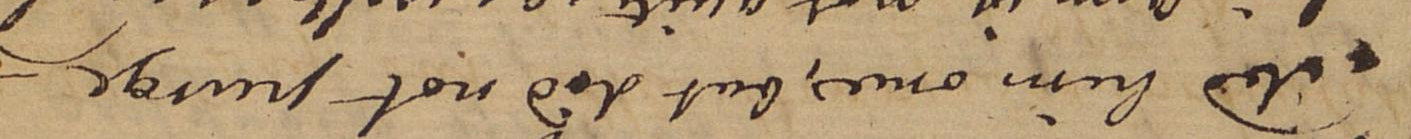-ited him once, but did not purge-
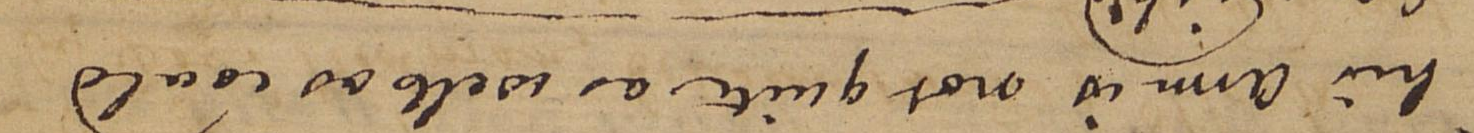his Arm is not quite as well as could
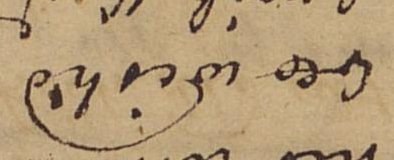be wish'd -
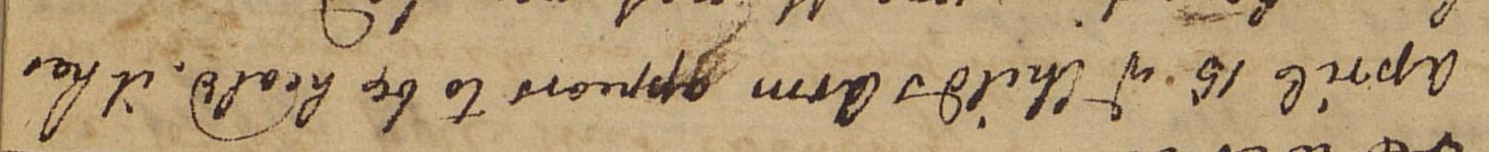April 15 y^e Childs Arm appears to be heal'd, it has
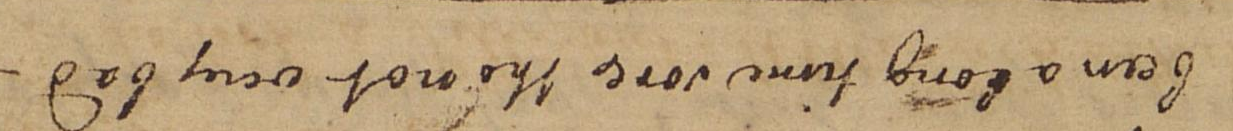been a long time sore tho not very bad -
